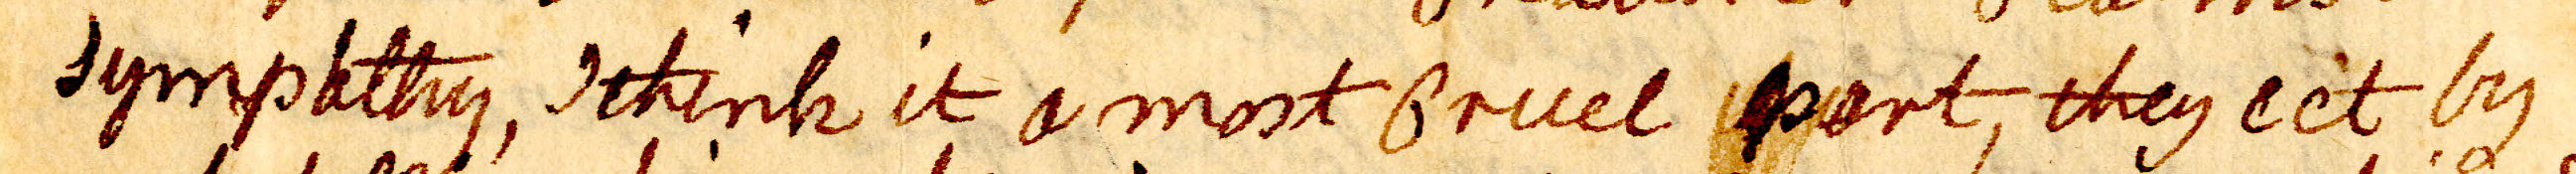sympathy, I think it a most cruel part they act by
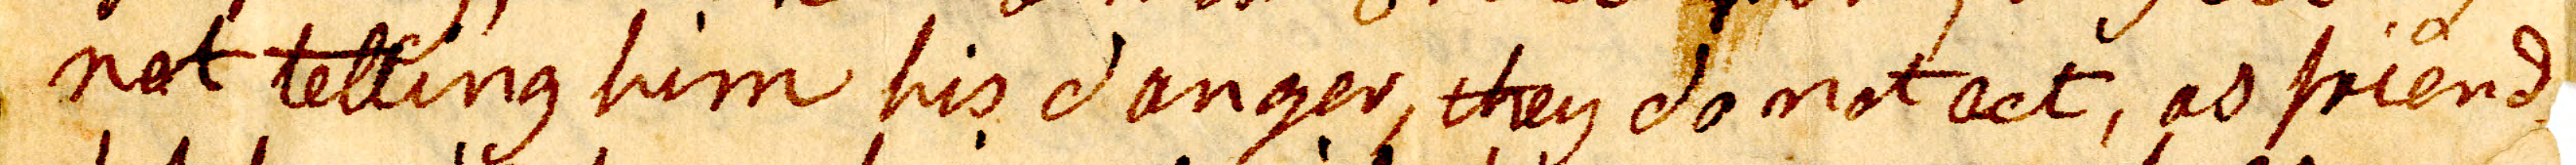not telling him his danger, they do not act, as friend
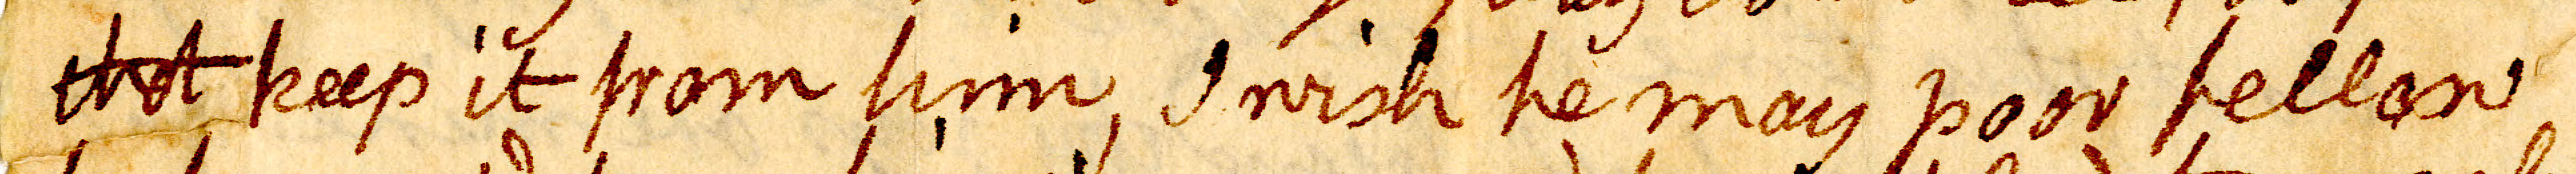that keep it from him, I wish he may poor fellow
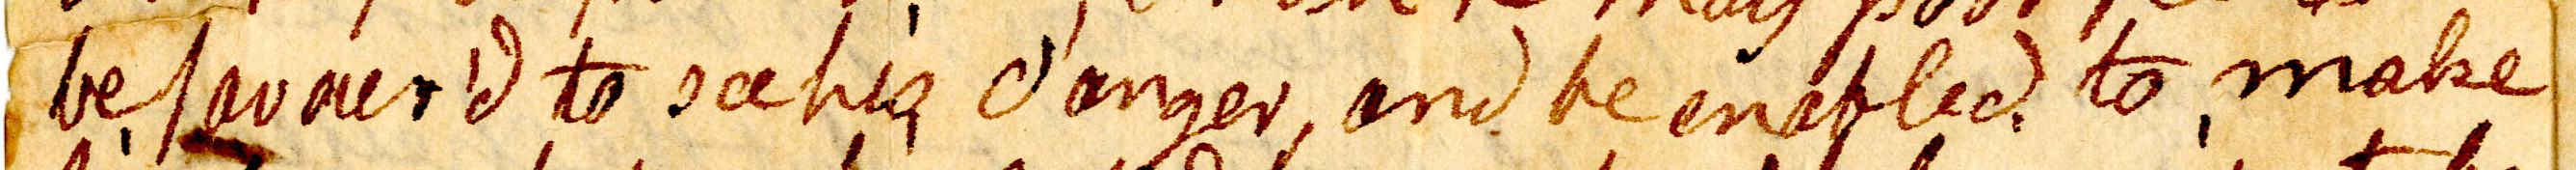be favour'd to see his danger, and be enabled to make
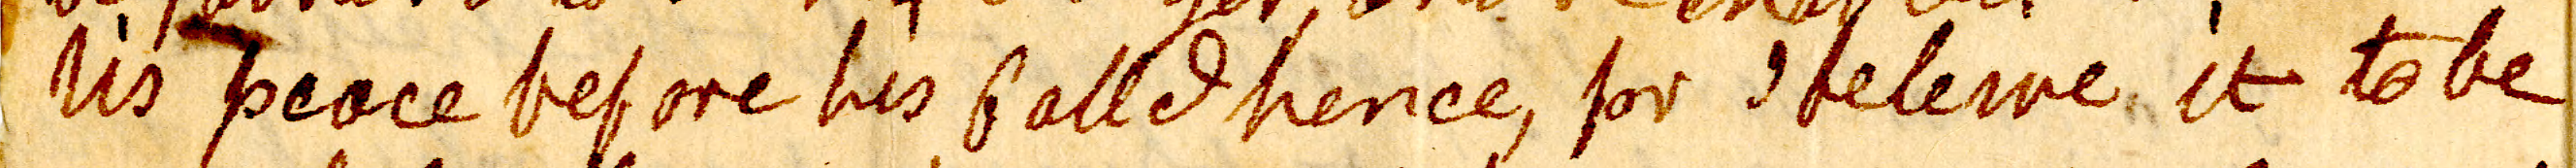his peace before his called hence, for I believe it to be
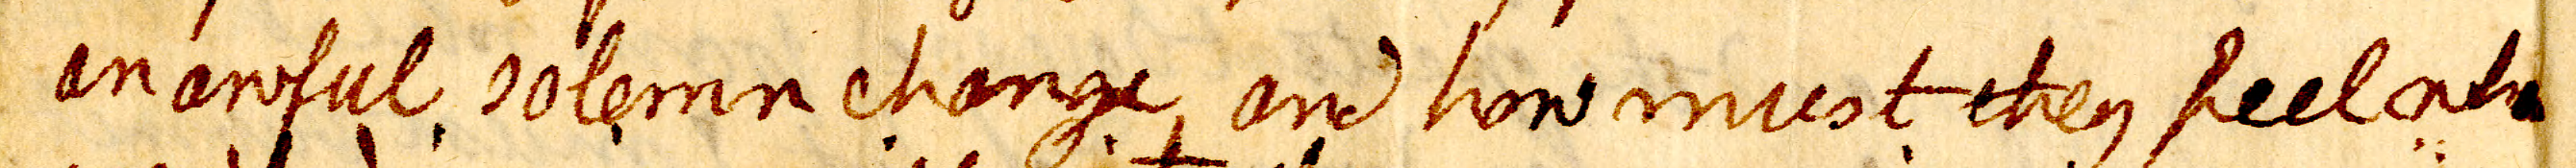an awful solemn change and how must they feel and
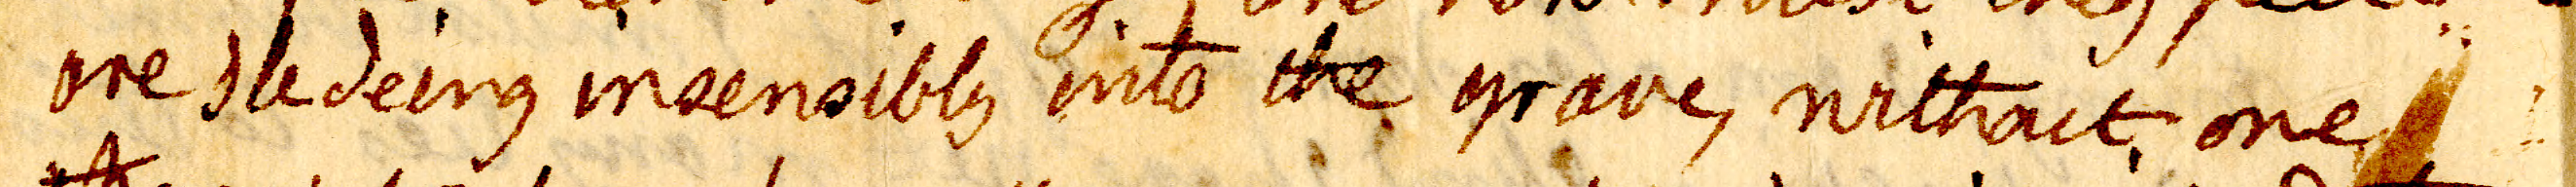one slideing insensibly into the grave, without one
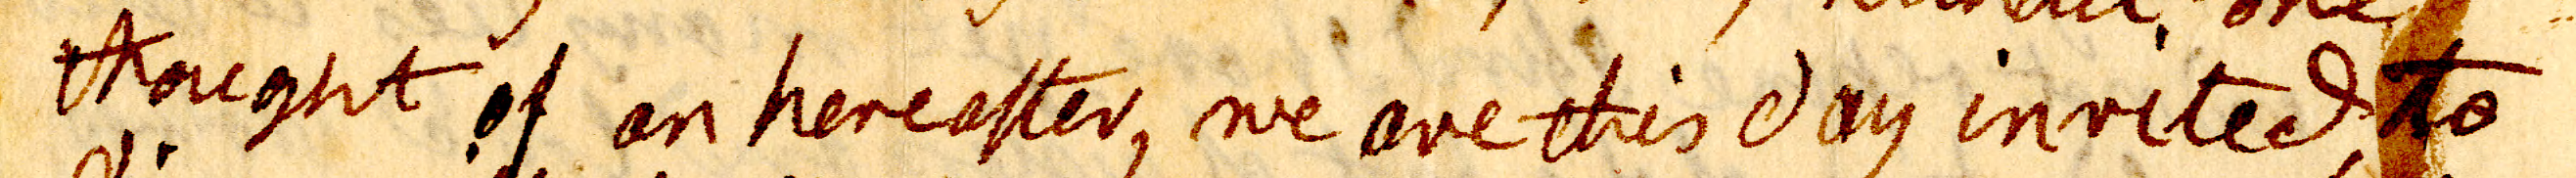thought of an hereafter we are this day invited to
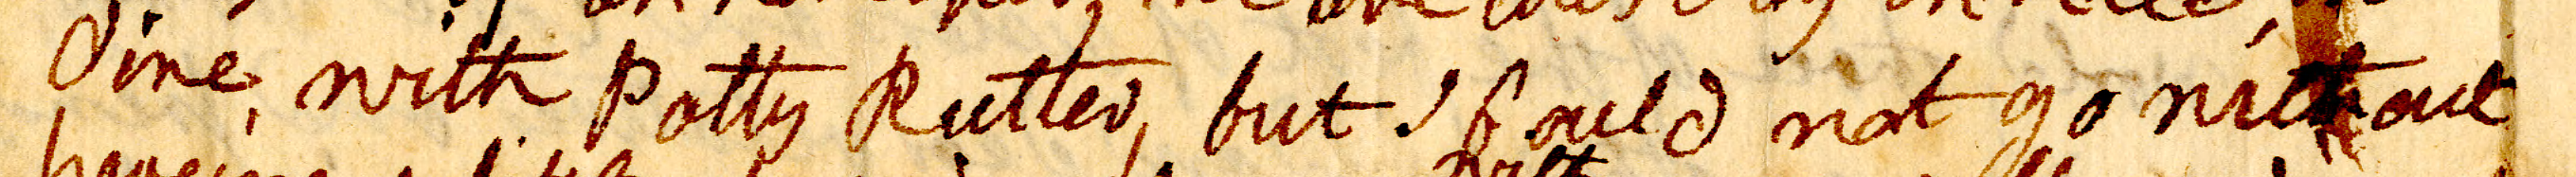dine with Patty Rutler, but I could not go without
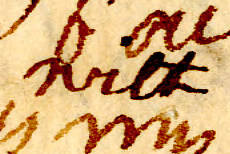with
